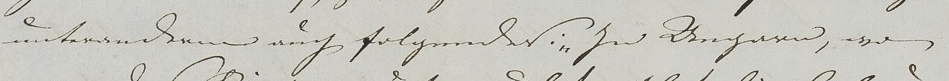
unteranderm auch folgendes: «In Ungarn, wo
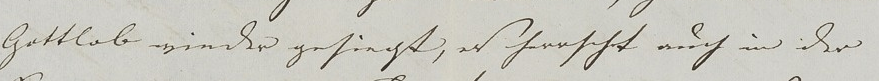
Gottlob wieder gesiegt, es herrscht auch in der
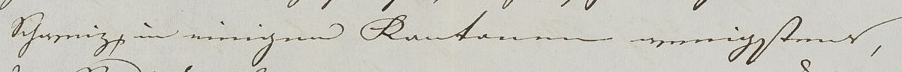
Schweiz, in einigen Kantonen wenigstens,
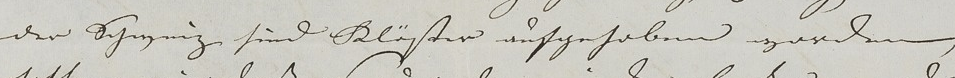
der Schweiz sind Klöster aufgehoben worden,
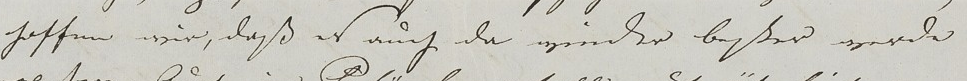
hoffen wir, daß es auch da wieder beßer werde
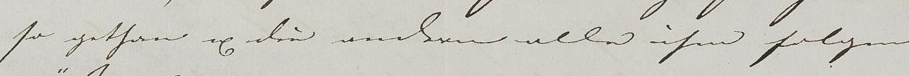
so gethan & die andern alle ihm folgen
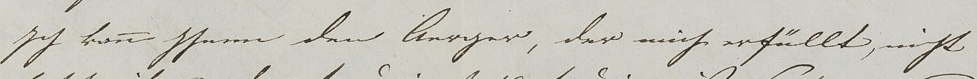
Ich kann Ihnen den Aerger, der mich erfüllt, nicht
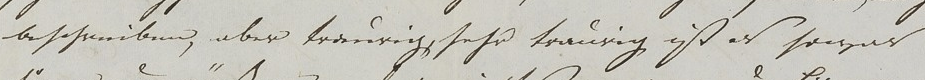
beschreiben, aber traurig, sehr traurig ist es sowas
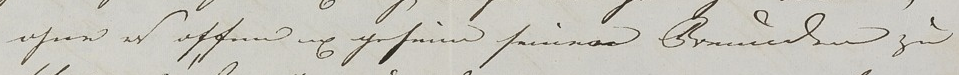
ohne es offen & geheim seinen Freunden zu
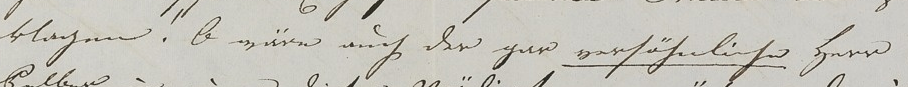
klagen! O wäre auch der gar versöhnliche Herr
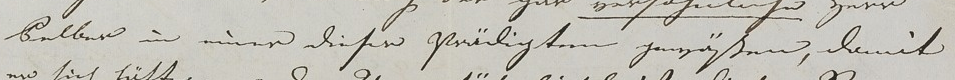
Felber in einer dieser Prädigten gewäßen, damit
